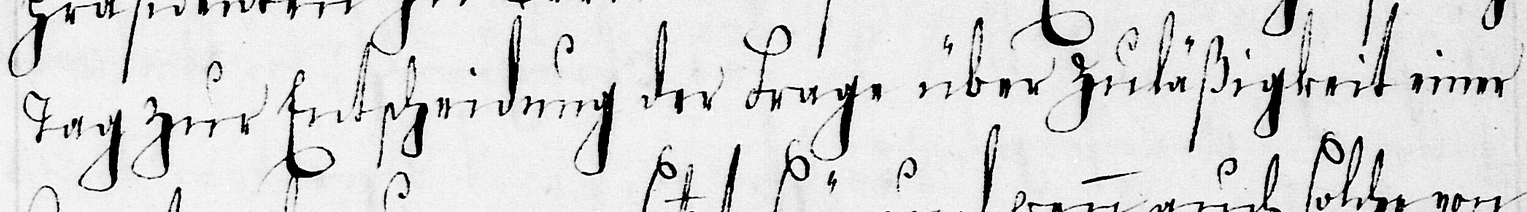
Tag zur Entscheidung der Frage über Zuläßigkeit einer
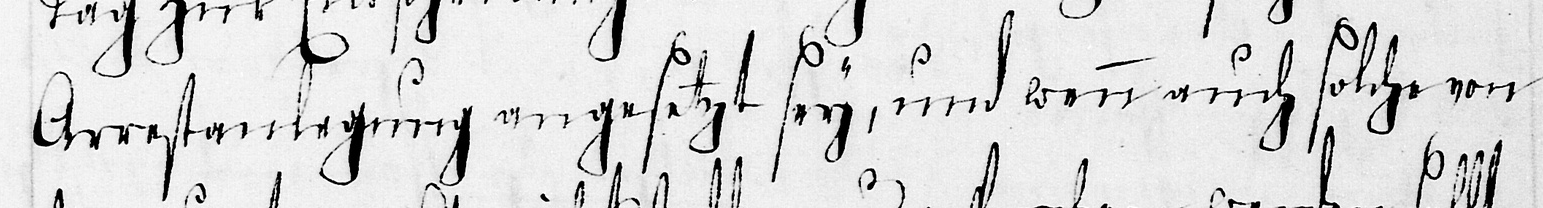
Arrestanlegung angesetzt sey, und wenn auch solche von
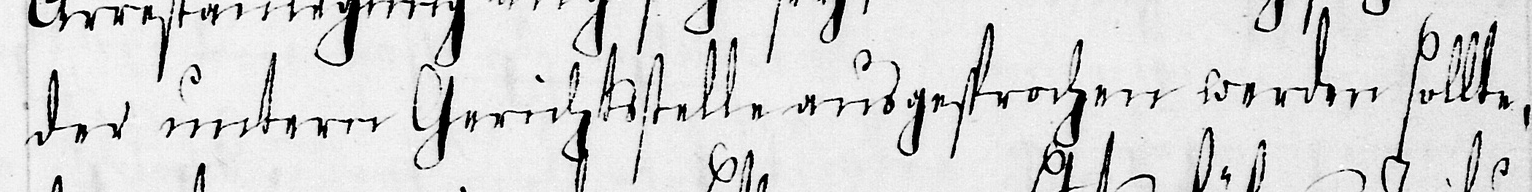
der untern Gerichtsstelle ausgesprochen werden sollt¬
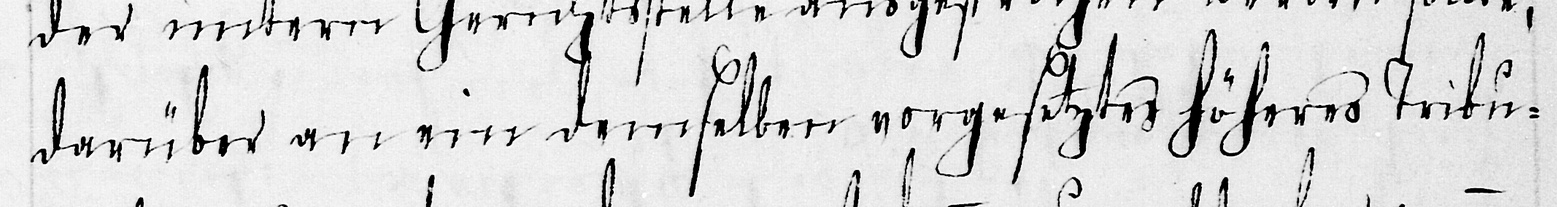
darüber an ein demselben vorgesetztes höheres Tribu¬
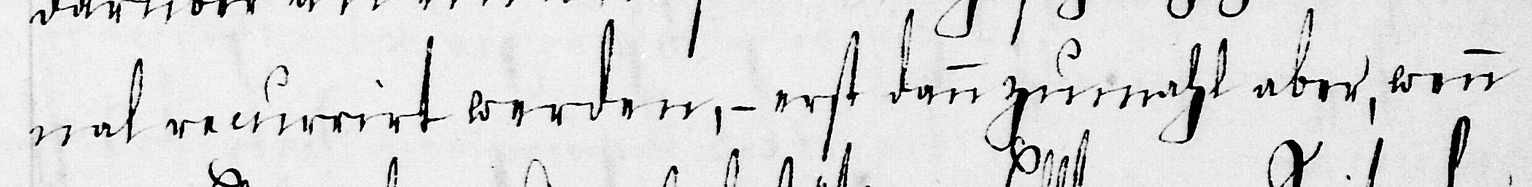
nal recurrirt werden, – erst dann zumahl aber, wenn
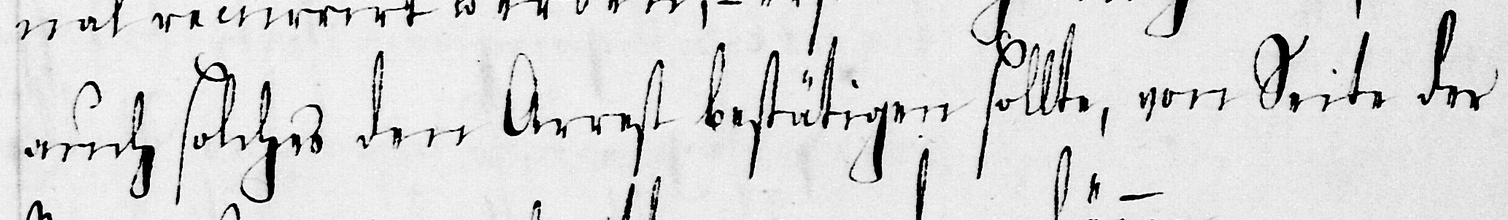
auch solches den Arrest bestätigen sollte, von Seite der
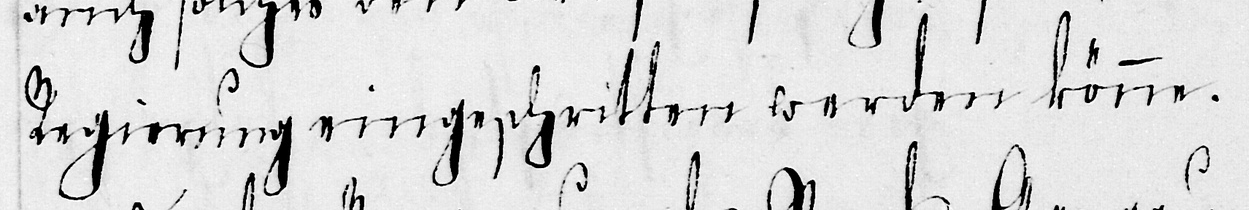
Regierung eingeschritten werden könne.
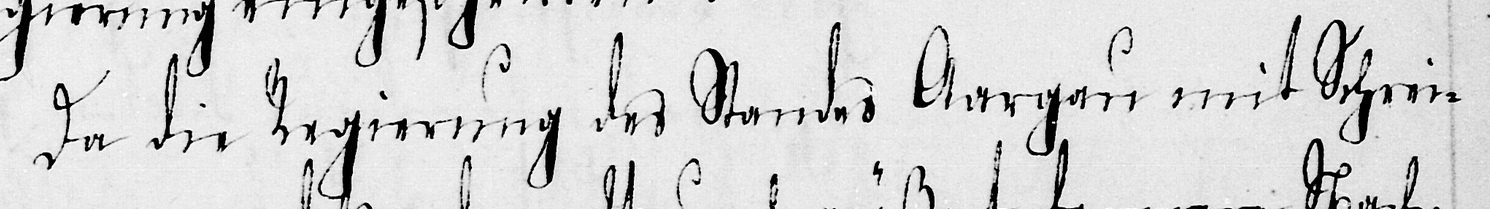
Da die Regierung des Standes Aargau mit Schrei¬
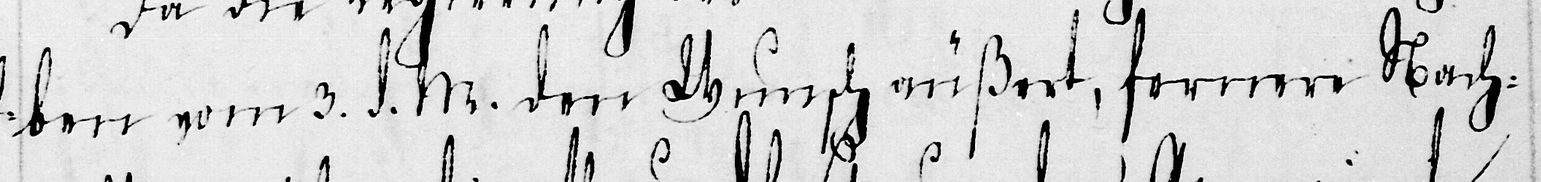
ben vom 3. d. M. den Wunsch äußert, fernere Nach¬
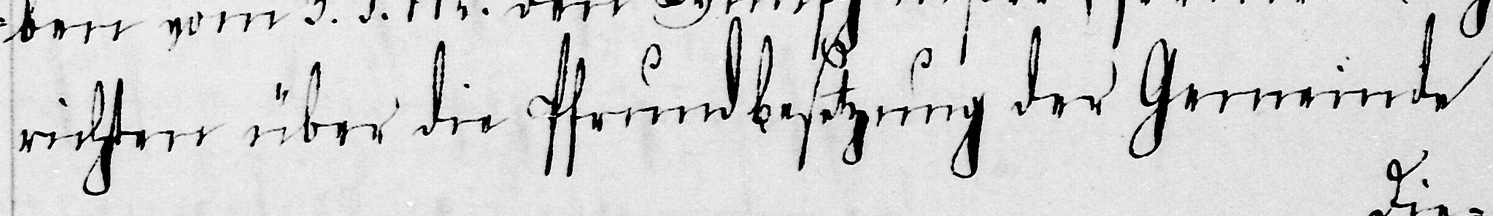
richten über die Pfrundbesetzung der Gemeinde
